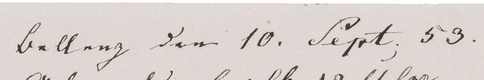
Bellenz den 10. Sept. 53.
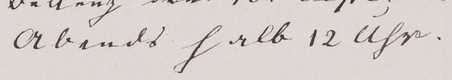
Abends halb 12 Uhr.
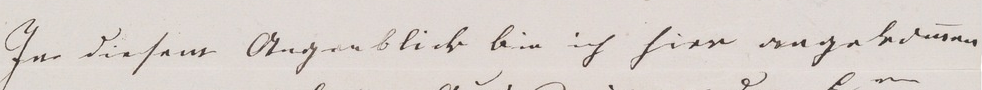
In diesem Augenblick bin ich hier angekommen
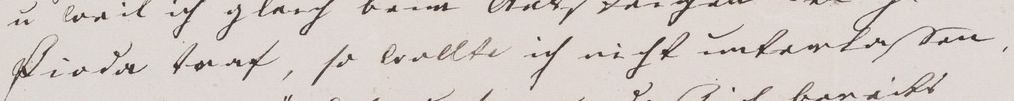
Pioda traf, so wollte ich nicht unterlassen,
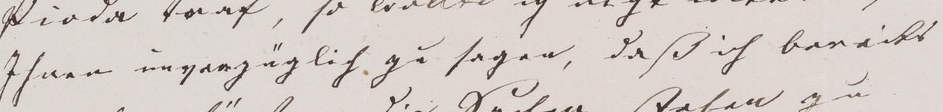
Ihnen unverzüglich zu sagen, daß ich bereits
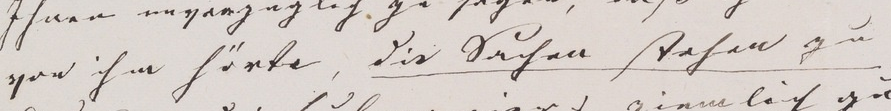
von ihm hörte, die Sachen stehen zu
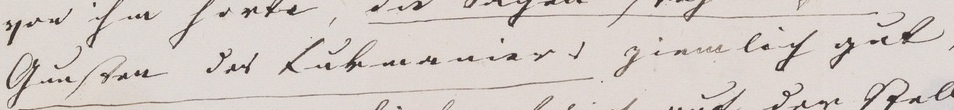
Gunsten des Lukmaniers ziemlich gut,
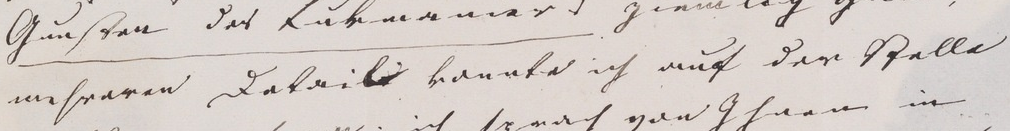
mehreren Detail konnte ich auf der Stelle
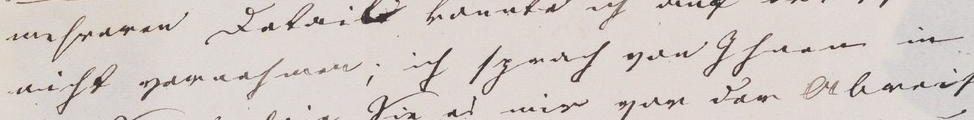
nicht vernehmen; ich sprach von Ihnen in
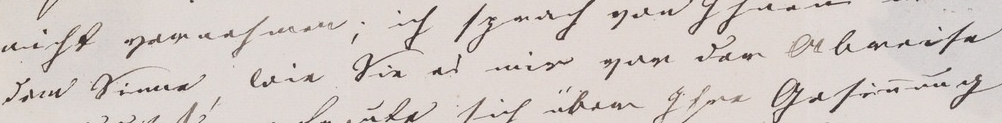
dem Sinne, wie Sie es mir vor der Abreise
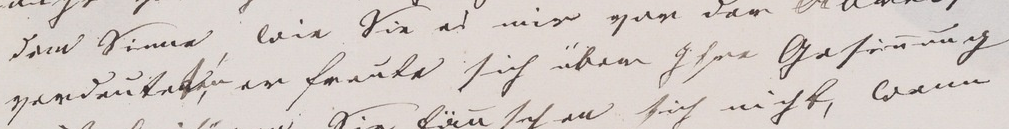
verdeuteten, er freute sich über Ihre Gesinnung
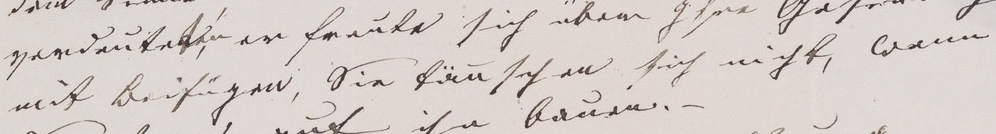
mit Beifügen, Sie täuschen sich nicht, wenn
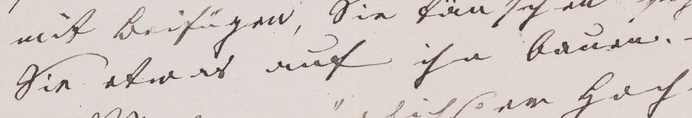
Sie etwas auf ihn bauen. –
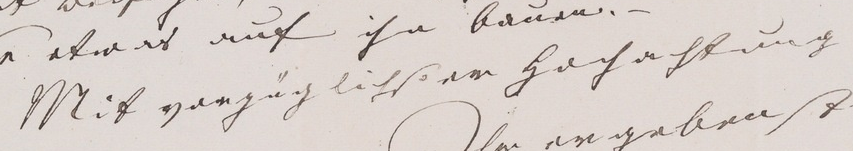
Mit vorzüglichster Hochachtung
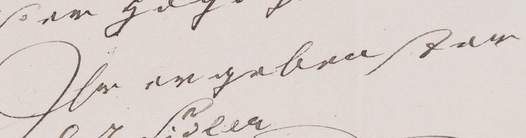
Ihr ergebenster
